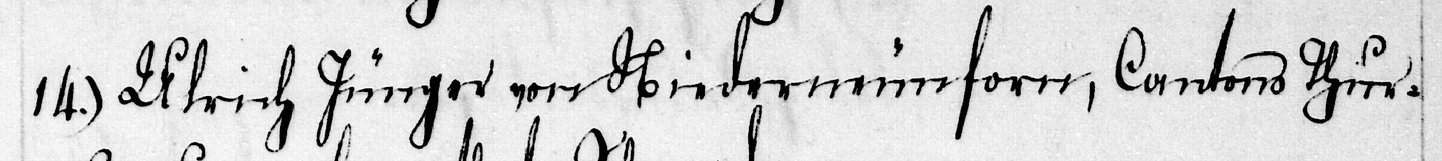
14.) Ulrich Jünger von Niederneunforn, Cantons Thur¬
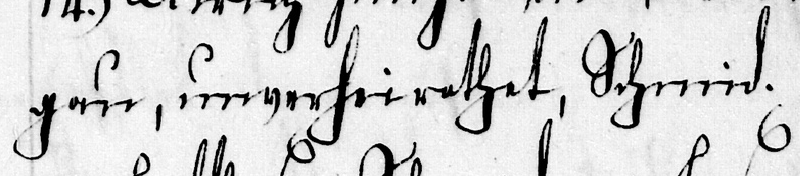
gau, unverheirathet, Schmid.
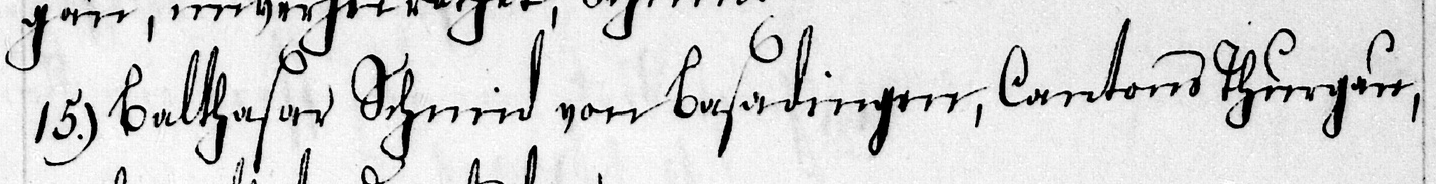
15.) Balthasar Schmid von Basadingen, Cantons Thurgau,
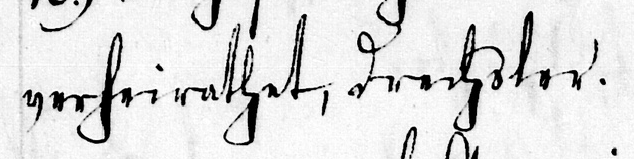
verheirathet, Drechsler.
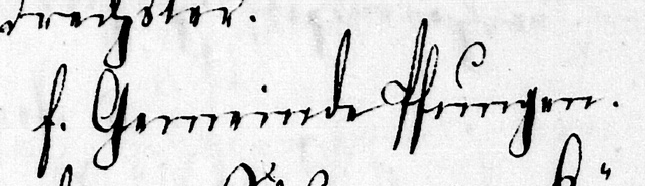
f. Gemeinde Pfungen.
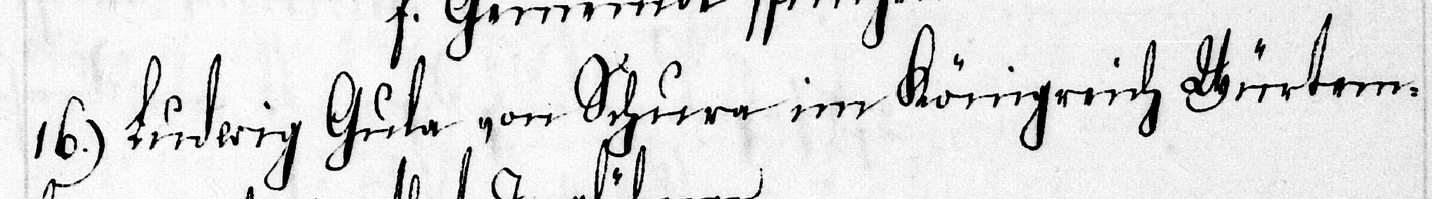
16.) Ludwig Gula von Schura im Königreich Würtem¬
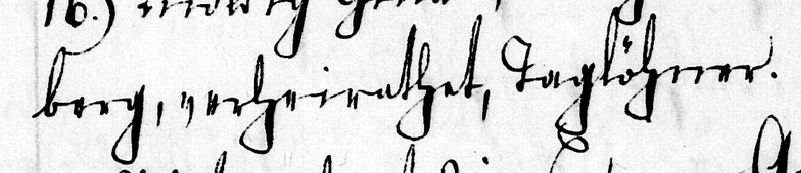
berg, verheirathet, Taglöhner.
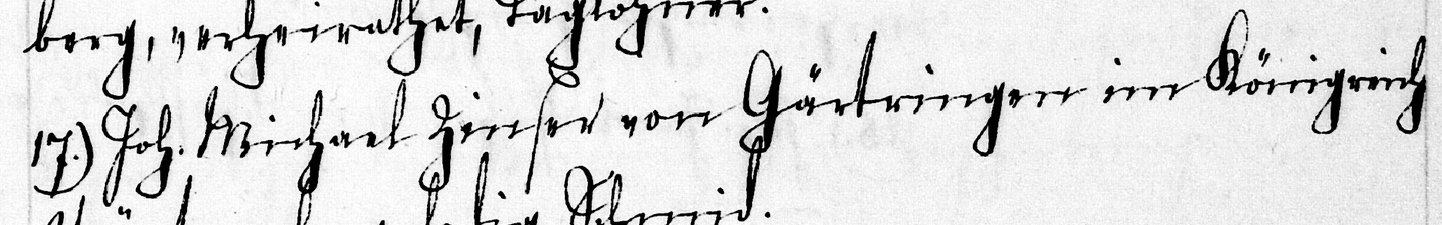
17.) Joh. Michael Zinser von Gärtringen im Königreich
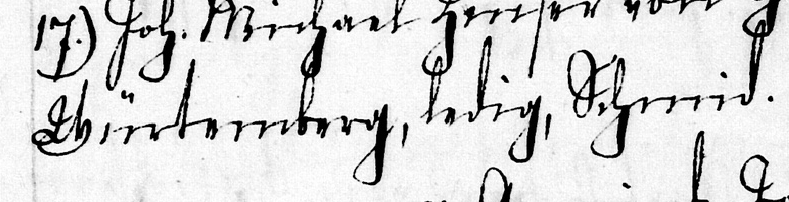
Würtemberg, ledig, Schmid.
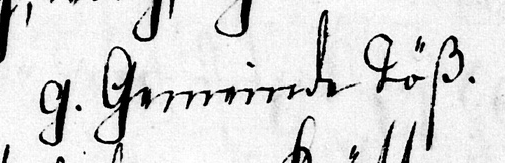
g. Gemeinde Töß.
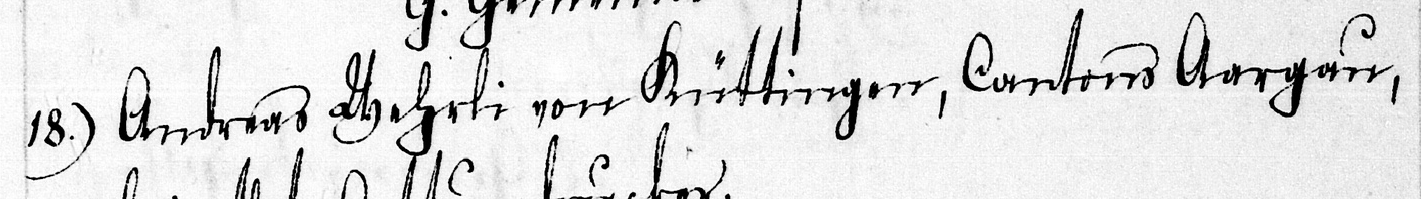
18.) Andreas Wehrli von Küttingen, Cantons Aargau,
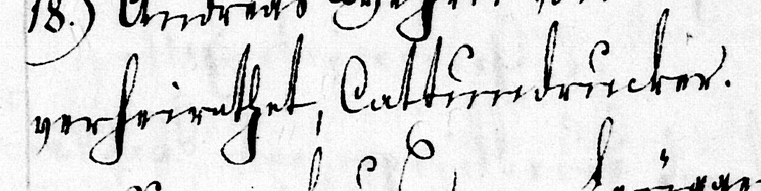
verheirathet, Cattundrucker.
